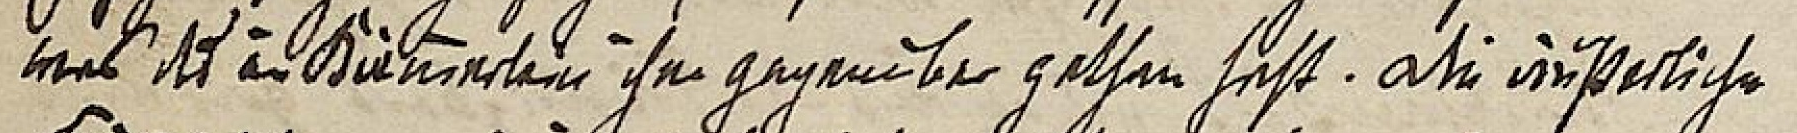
was du im Kämerlein ihm gegenüber gethan hast. Die äußerliche
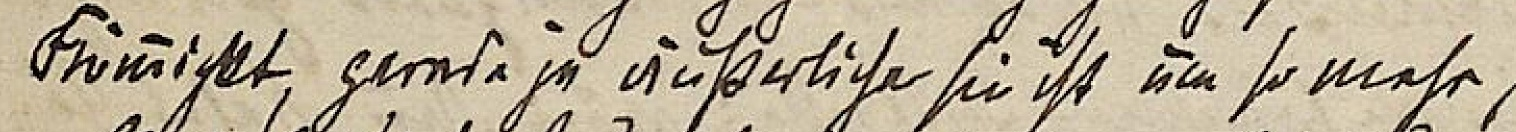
Frömigkeit, gerade ja äußerliche sie ist um so mehr,
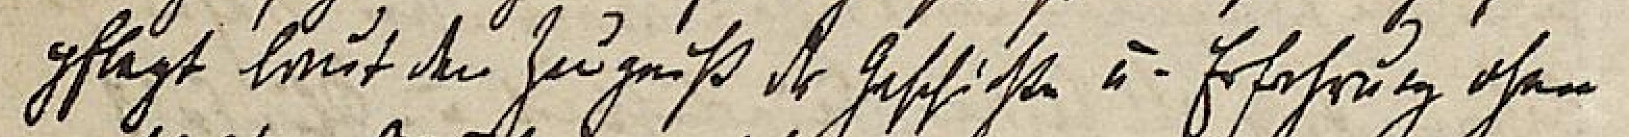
pflegt laut dem Zeugniß der Geschichte u. Erfahrung ohne
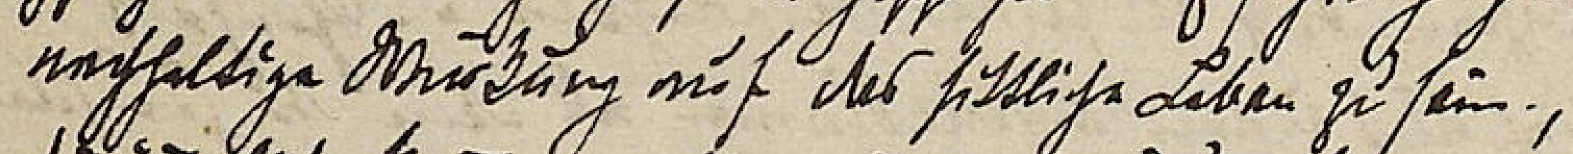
nachhaltige Wirkung auf das sittliche Leben zu sein,
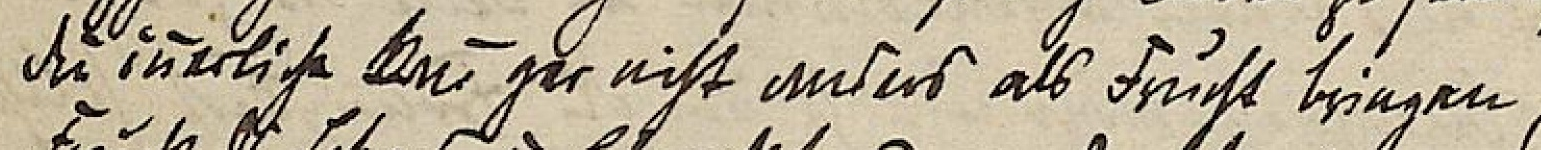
die inerliche kan gar nicht anders als Fruch bringen,
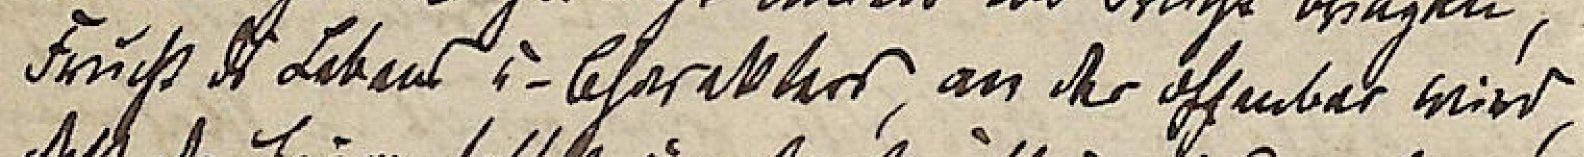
Frucht ds Lebens u. Charakters, an der offenbar wird,
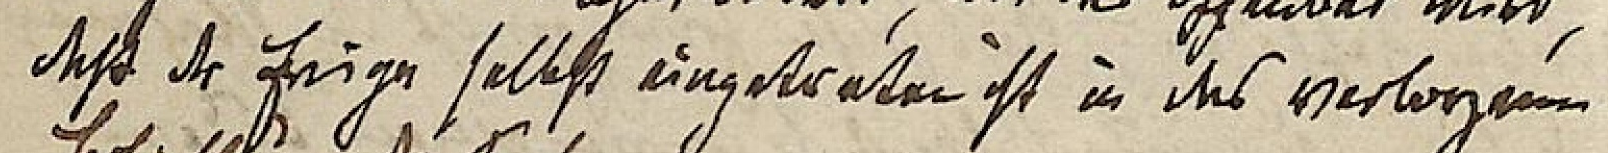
daß dr. Ewige selbst eingetreten ist in das verborgene
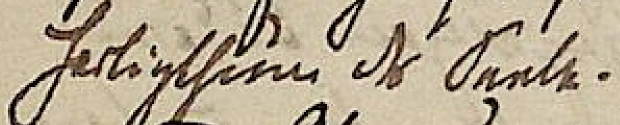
Heiligthum dr Seele.
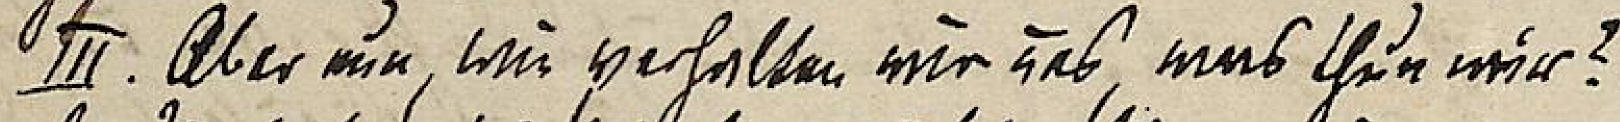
III. Aber nun, wie verhalten wir uns, was thun wir?
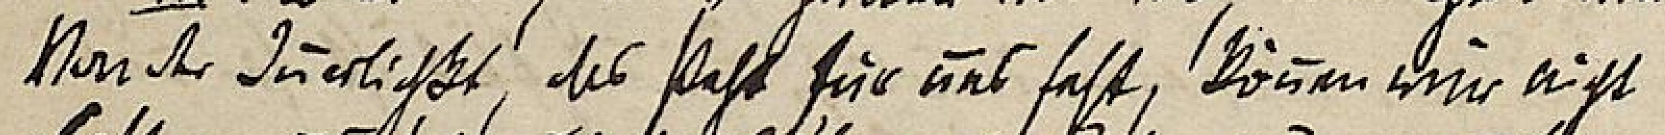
Von der Inerlichkt, des steht für uns fest, könen wir nicht
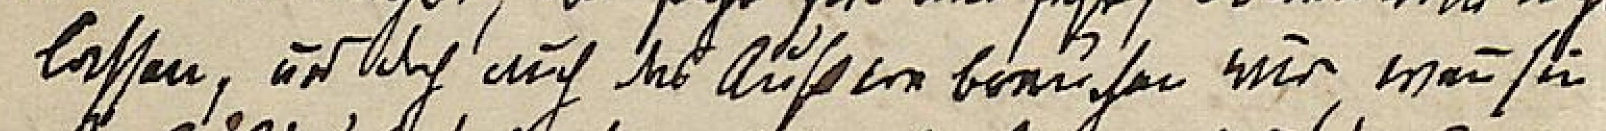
lassen, und dch auch das Äußere brauchen wir, wen sie
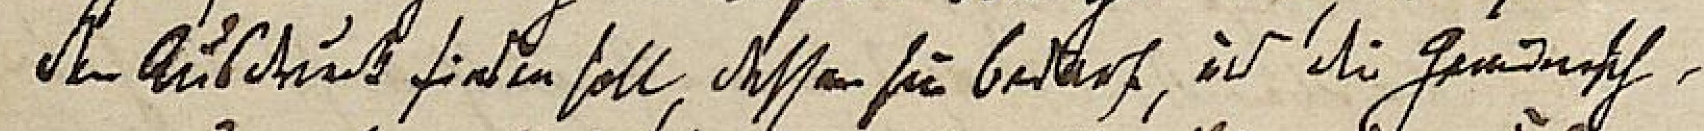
den Ausdruck finden soll, dess sie bedarf, und die Gemeinschaft,
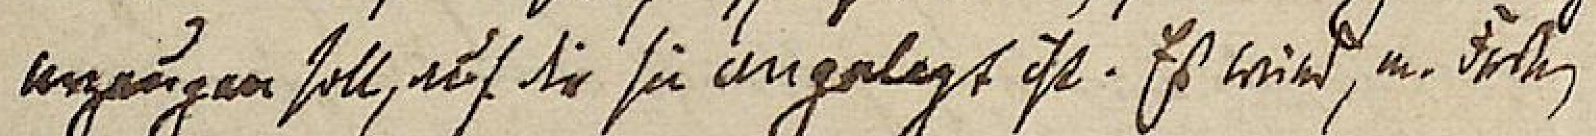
erzeugen soll, auf die sie angelegt ist. Es wird, m. Frde,
